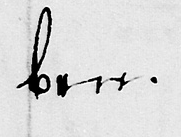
ben.
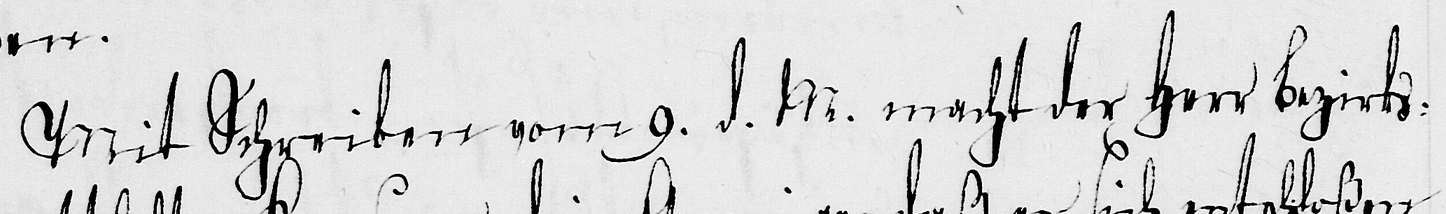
Mit Schreiben vom 9. d. M. macht der Herr Bezirks¬
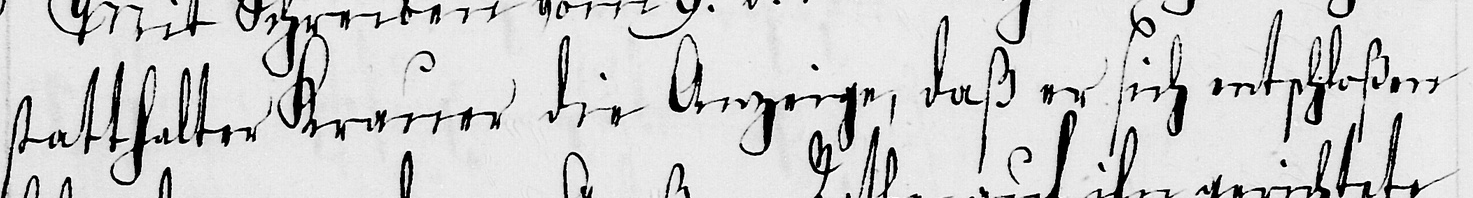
statthalter Krauer die Anzeige, daß er sich entschloßen
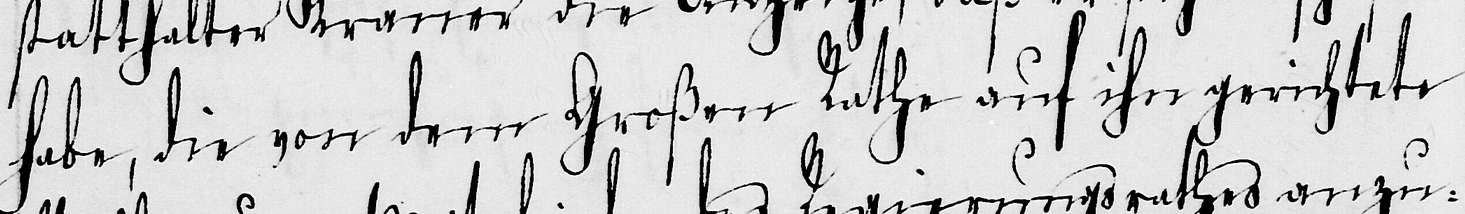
habe, die von dem Großen Rathe auf ihn gerichtete
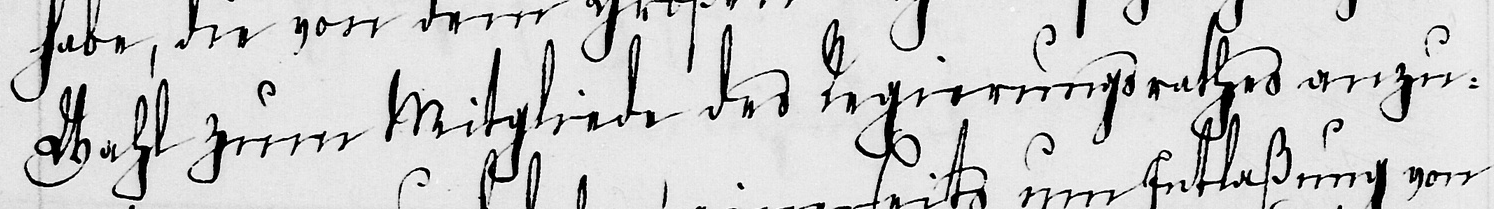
Wahl zum Mitgliede des Regierungsrathes anzu¬
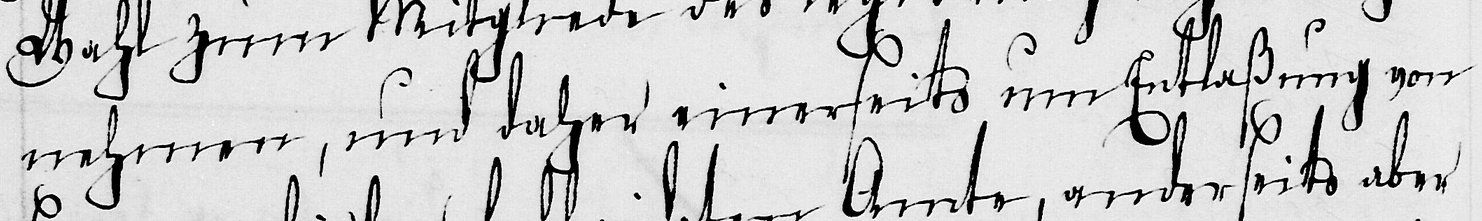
nehmen, und daher einerseits um Entlaßung von
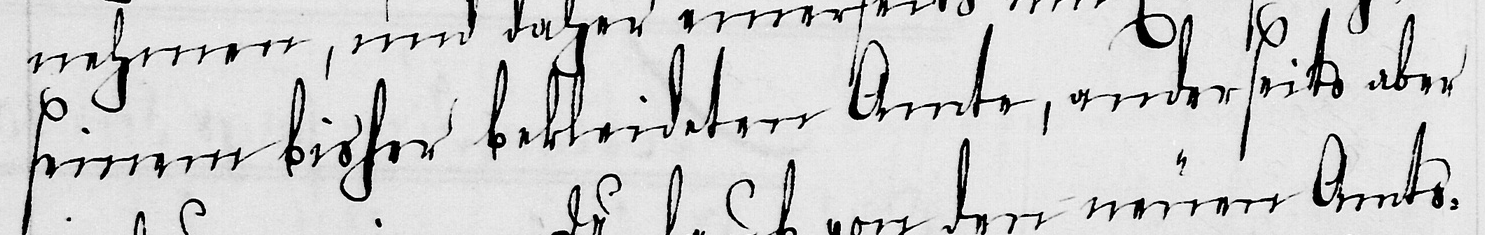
seinem bisher bekleideten Amte, anderseits aber
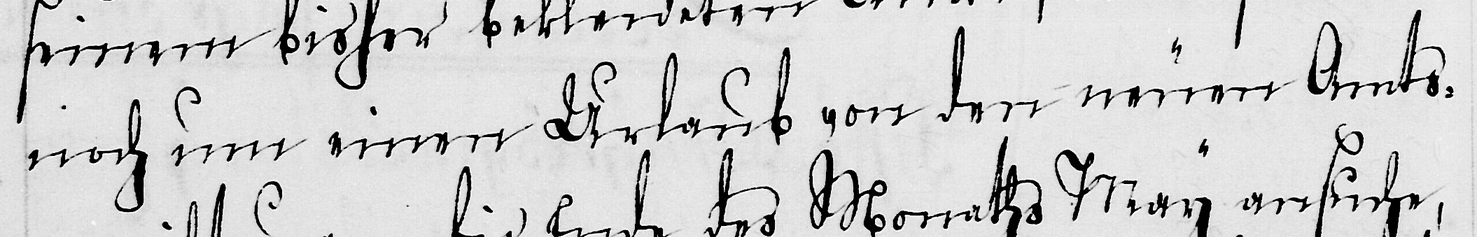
noch um einen Urlaub von den neuen Amts¬
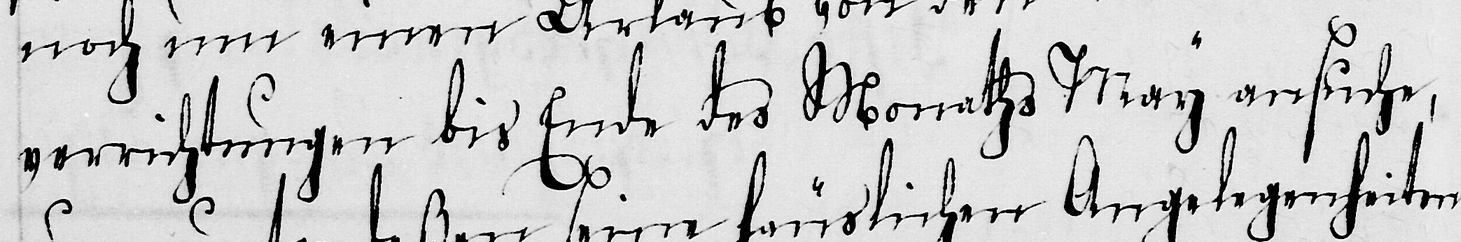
verrichtungen bis Ende des Monaths May ansuche,
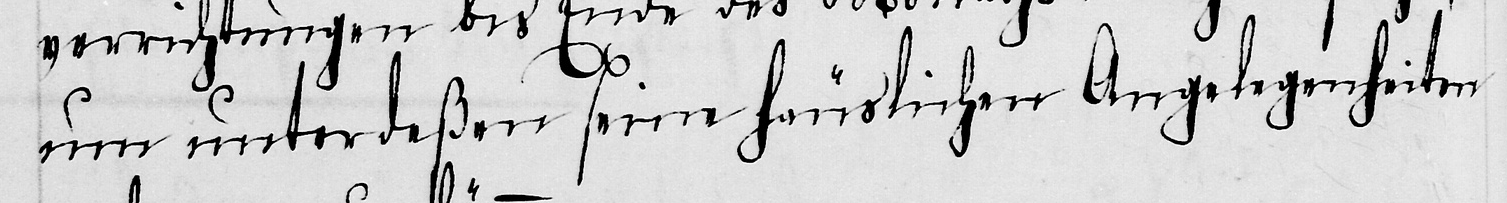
um unterdeßen seine häuslichen Angelegenheiten
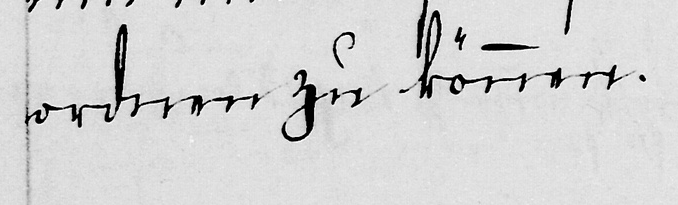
ordnen zu können.
